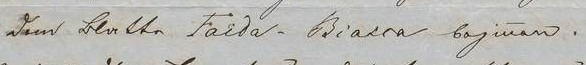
dem Blatte Faido–Biasca beginnen.
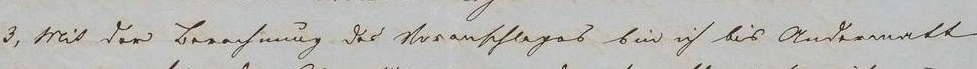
3, Mit der Berechnung des Voranschlages bin ich bis Andermatt
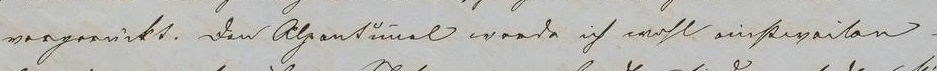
vorgerückt. Den Alpentunnel werde ich wohl einstweilen –
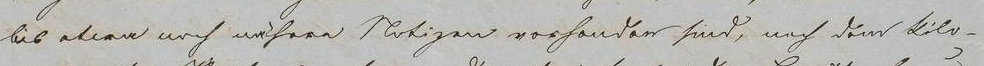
bis etwa noch nähere Notizen vorhanden sind, nach dem kilo-
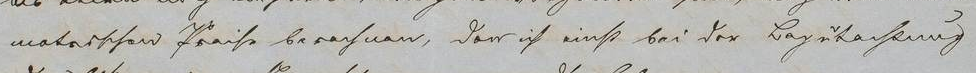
metrischen Preise berechnen, den ich einst bei der Begutachtung
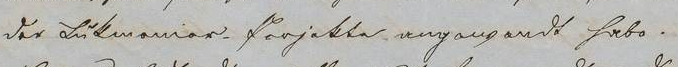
der Lukmanier-Projekte angewandt habe.
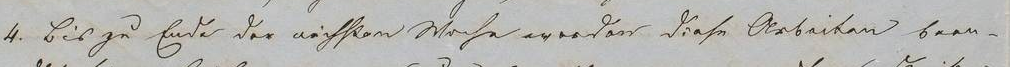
4. Bis zu Ende der nächsten Woche werden diese Arbeiten been-
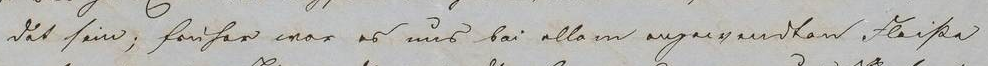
det sein; früher war es uns bei allem angewandten Fleiße
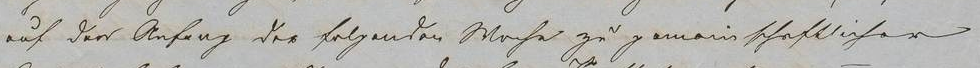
auf den Anfang der folgenden Woche zu gemeinschaftlicher
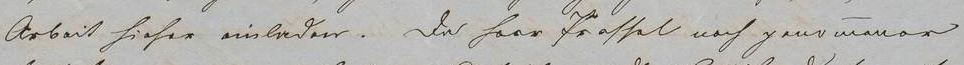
Arbeit hieher einladen. Da Herr Pressel nach genommener
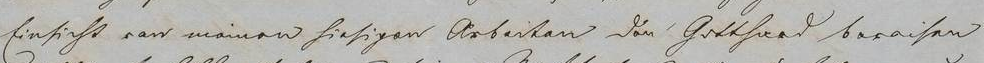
Einsicht von meinen hiesigen Arbeiten den Gotthard bereisen
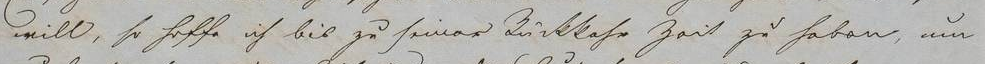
will, so hoffe ich bis zu seiner Rückkehr Zeit zu haben, um
